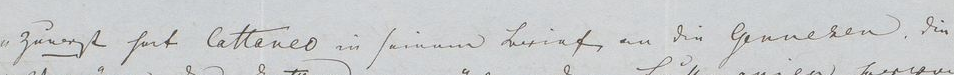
Zuerst hat Cattaneo in seinem Brief an die Genuesen, die
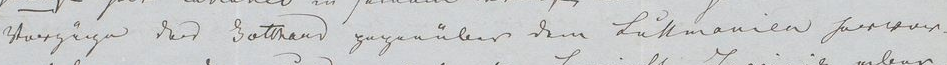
Vorzüge des Gotthard gegenüber dem Lukmanier hervor-
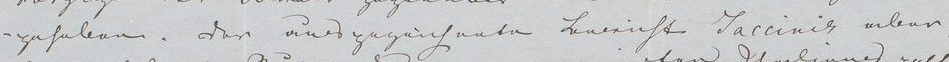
gehoben. Der ausgezeichnete Bericht Jaccinis aber,
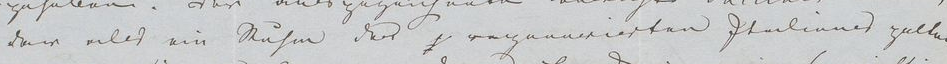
der als ein Ruhm des j regenerirten Italiens gelten
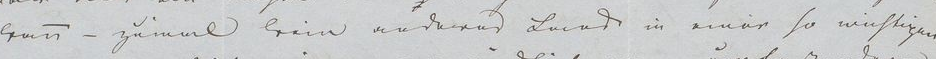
kann, zumal kein anderes Land in einer so wichtigen
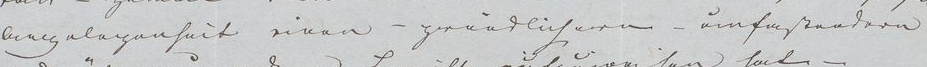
Angelegenheit einen, gründlichern, umfaßendern
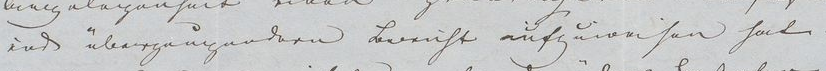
und überzeugendern Bericht aufzuweisen hat. –
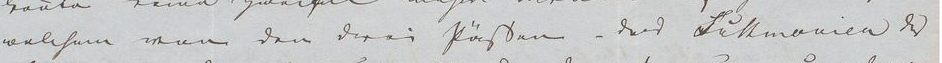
welchem von den drei Pässen, des Lukmanier, des
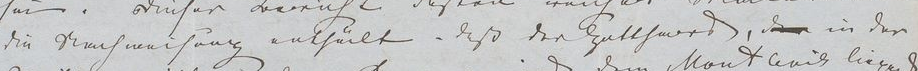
die Nachweisung enthält, daß der Gotthard, der in der
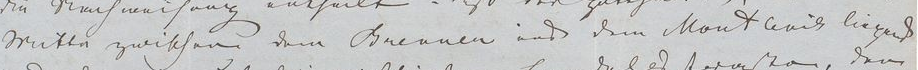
Mitte zwischen dem Brenner und dem Mont Cenis liegend
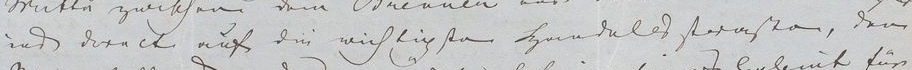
und direct auf die wichtigste Handelsstraße, den
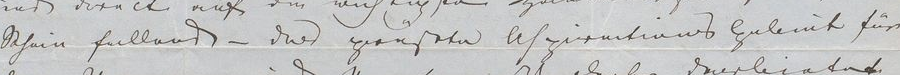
Rhein fallend, das größte AspirationsGebiet für
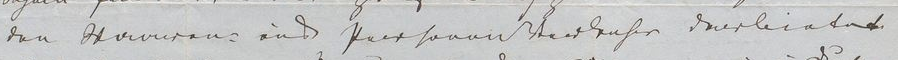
den Waaren- und PersonenVerkehr darbietet
